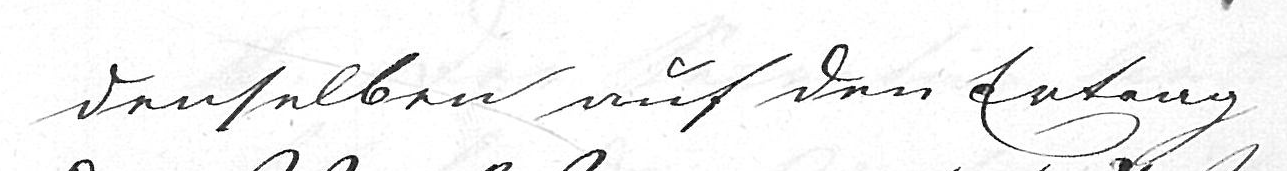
denselben auf den Ertrag
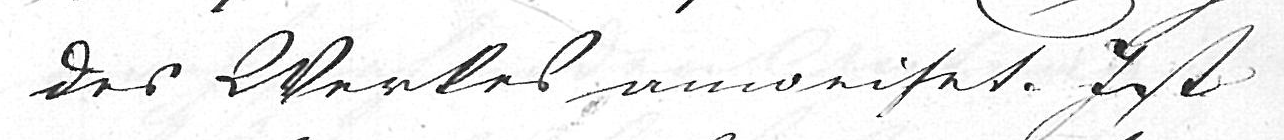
des Werkes anweiset. Ist
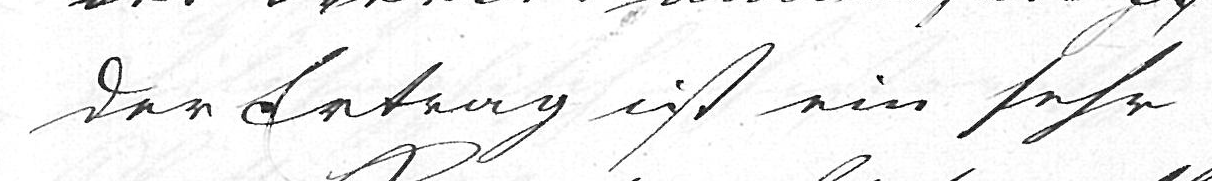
der Ertrag ist ein sehr
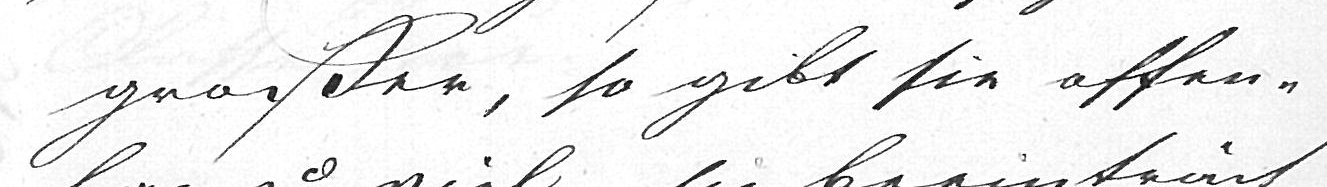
großer, so gibt sie offen-
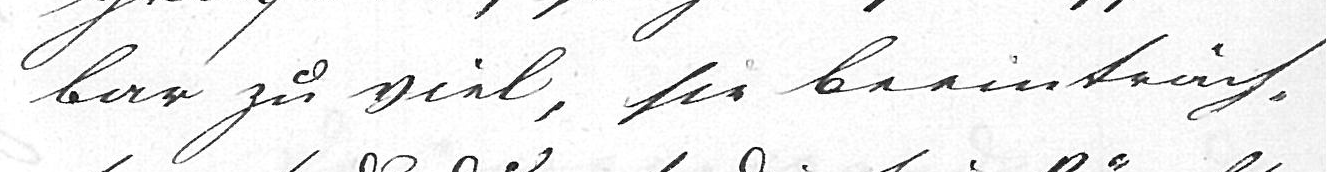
bar zu viel, sie beeinträch-
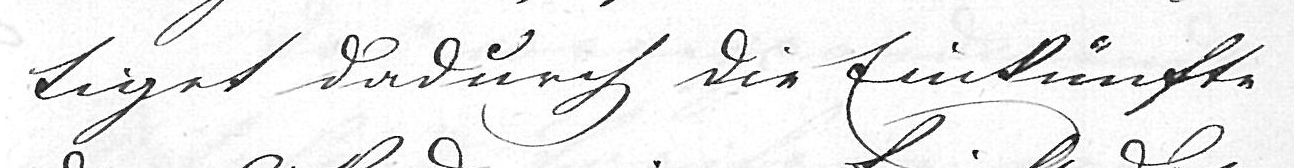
tiget dadurch die Einkünfte
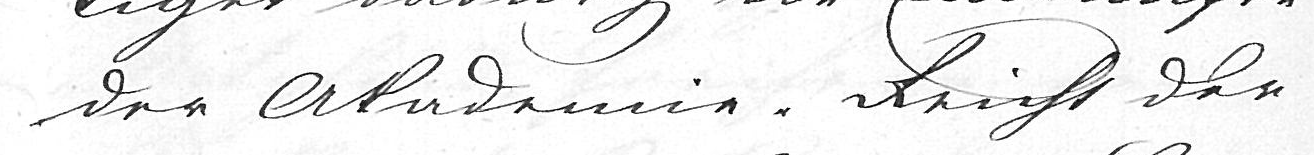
der Akademie. Reicht der-
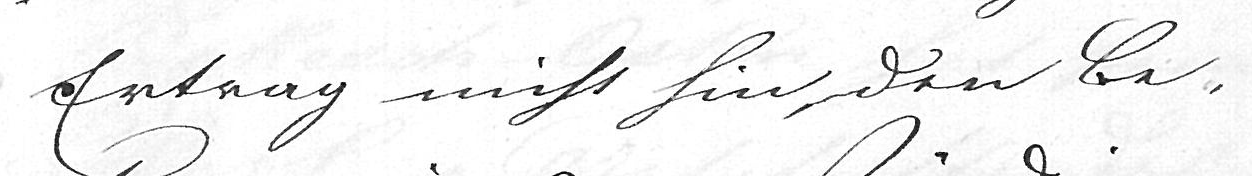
Ertrag nicht hin, den Be-
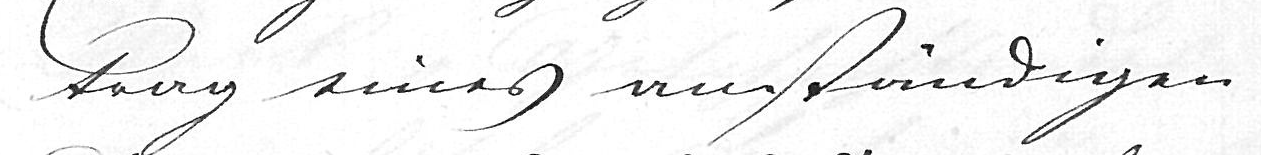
trag eines anständigen
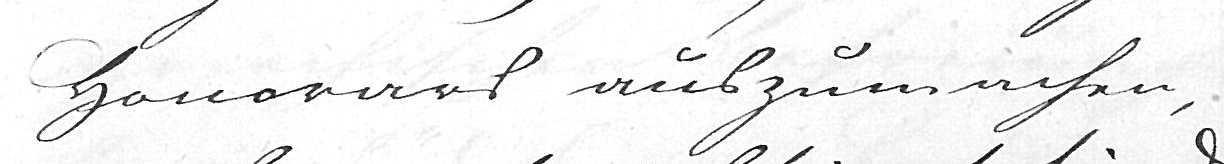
Honorars auszumachen,
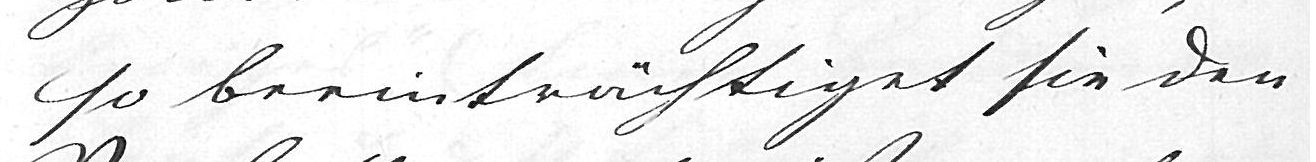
so beeinträchtiget sie den
